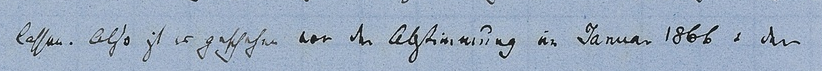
lassen. Also ist es geschehen vor der Abstimmung im Januar 1866: der
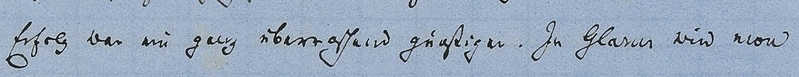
Erfolg war ein ganz überraschend günstiger. In Glarus wird man
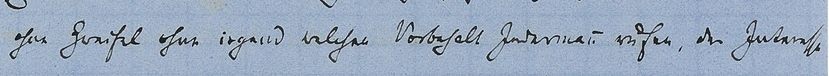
ohne Zweifel ohne irgend welchen Vorbehalt Jedermann rufen, der Interesse
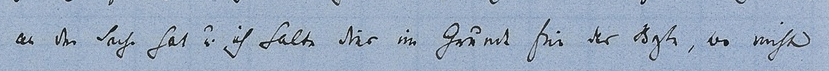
an der Sache hat u. ich halte dies im Grunde für das Beste, wo nicht
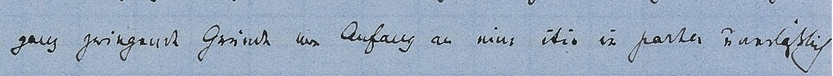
ganz zwingende Gründe von Anfang an eine itio in partes unerläßlich
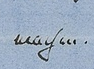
machen.
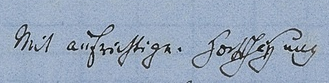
Mit aufrichtiger Hochschätzung
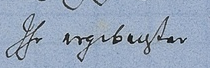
Ihr ergebenster
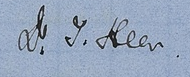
Dr J. Heer.
